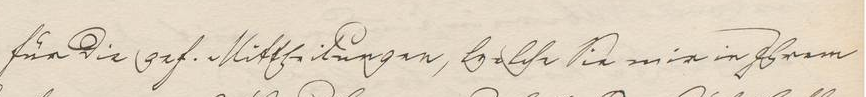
Für die gef. Mittheilungen, welche Sie mir in Ihrem
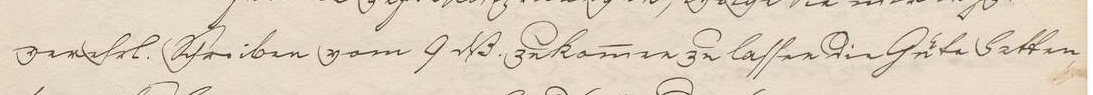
verehrl. Schreiben vom 9 dß. zukommen zu lassen die Güte hatten,
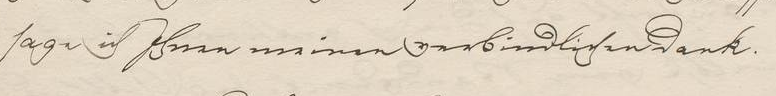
sage ich Ihnen meinen verbindlichen Dank.
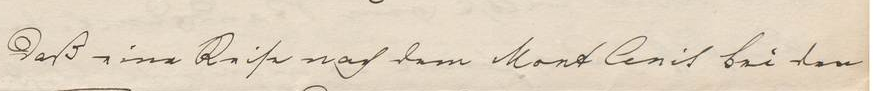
Daß eine Reise nach dem Mont Cenis bei den
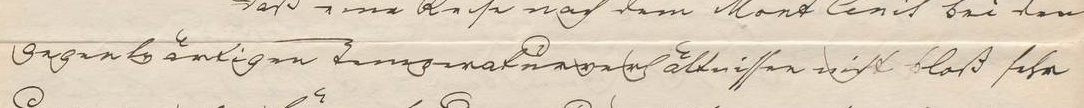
gegenwärtigen Temperaturverhältnissen nicht bloß sehr
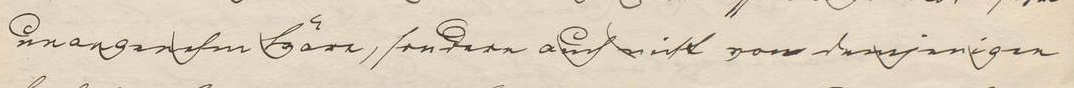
unangenehm wäre, sondern auch nicht von demjenigen
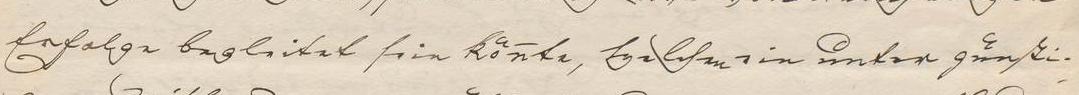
Erfolge begleitet sein könnte, welchen ein unter günsti-
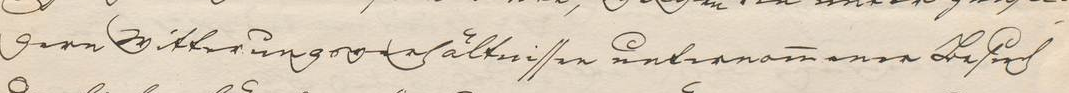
gern Witterungsverhältnissen unternommener Besuch
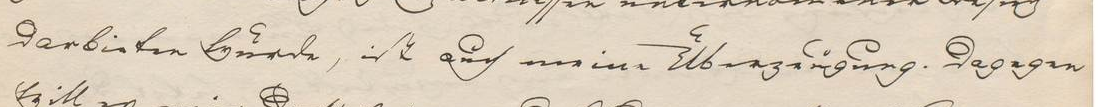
darbieten würde, ist auch meine Überzeugung. Dagegen
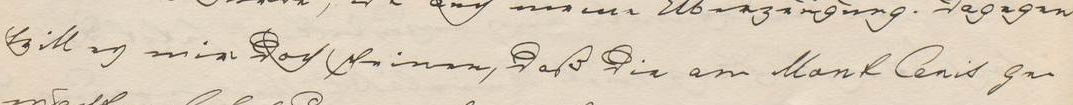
will es mir doch scheinen, daß die am Mont Cenis ge-
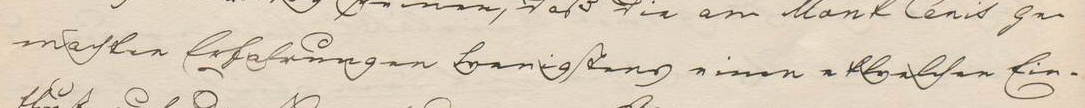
machten Erfahrungen wenigstens einen etwelchen Ein-
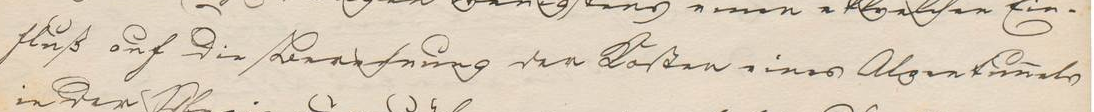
fluß auf die Berechnung der Kosten eines Alpentunnels
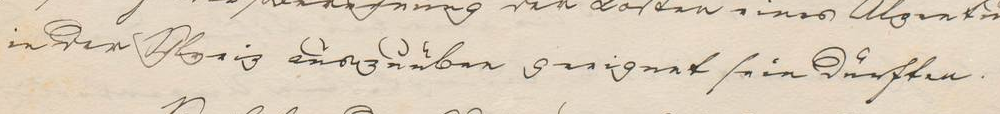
in der Schweiz auszuüben geeignet sein dürften.
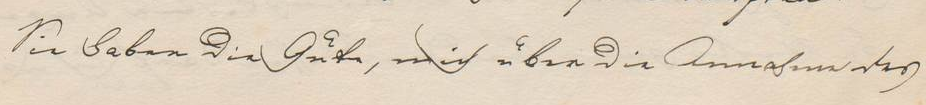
Sie haben die Güte, mich über die Annahme des
